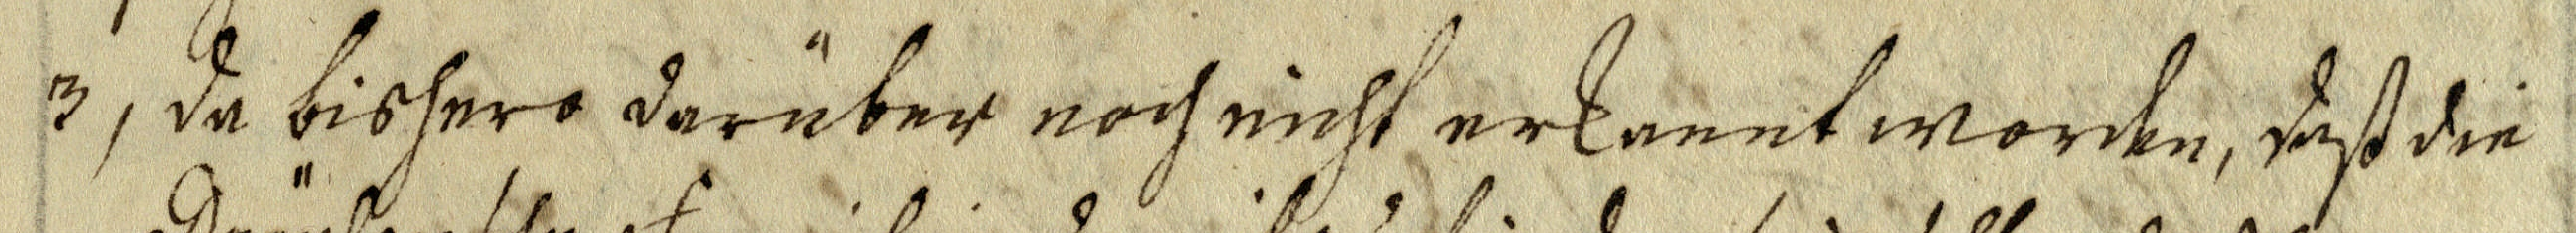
3, da bishero darüber noch nicht erkannt worden, daß die
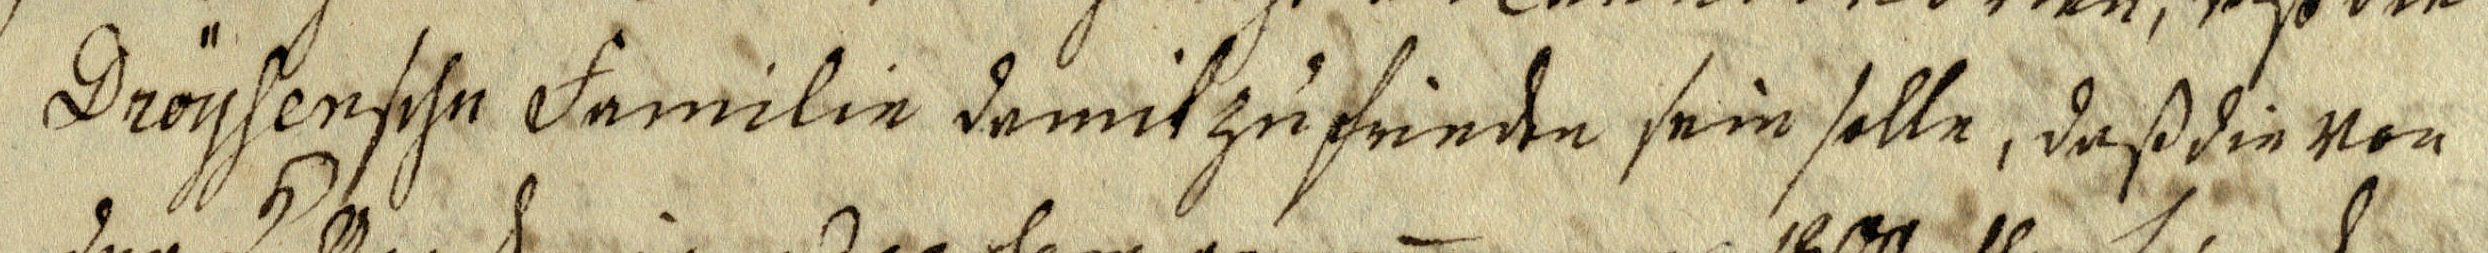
Droÿsensche Familie damit zufrieden sein solle, daß die von
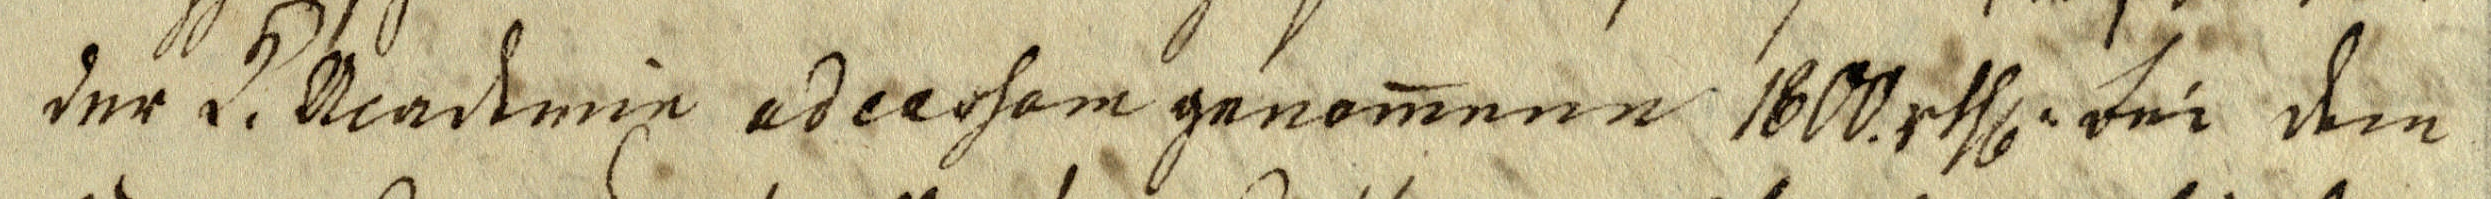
der K. Academie ad cassam genomene 1800. r: bei dem
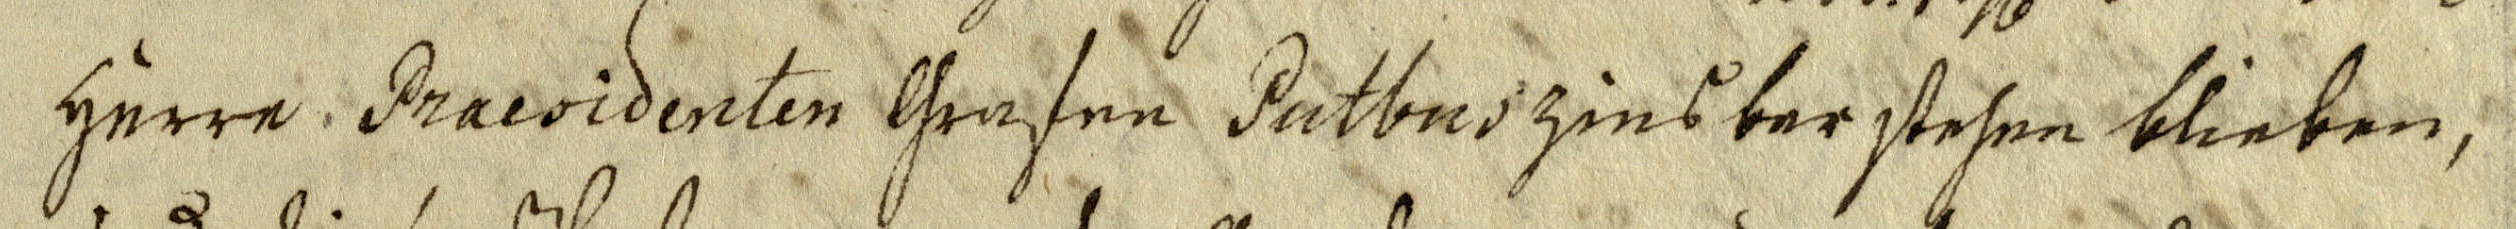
Herrn Praesidenten Grafen Putbus zins bar stehen blieben,
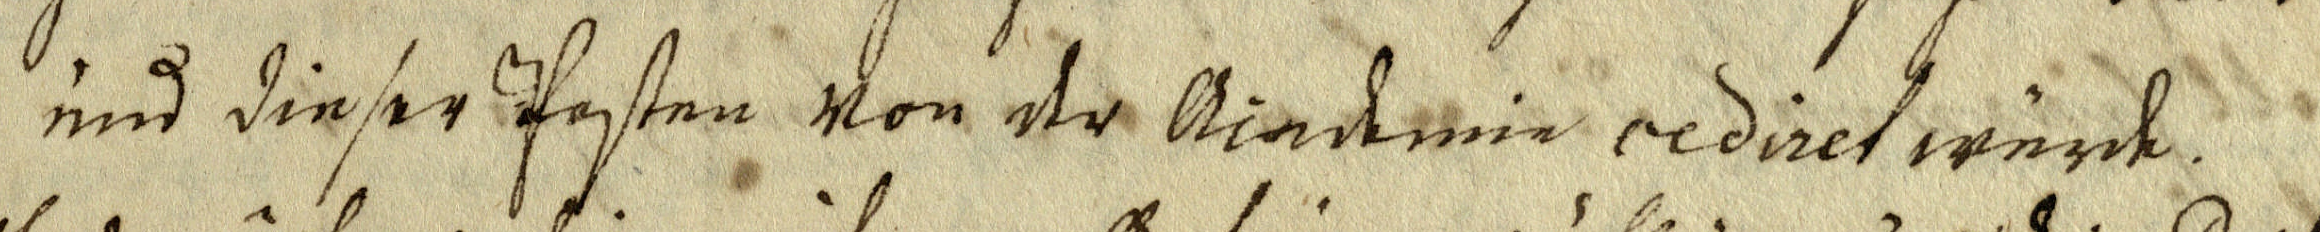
und dieser Posten von der Academie cediret würde.
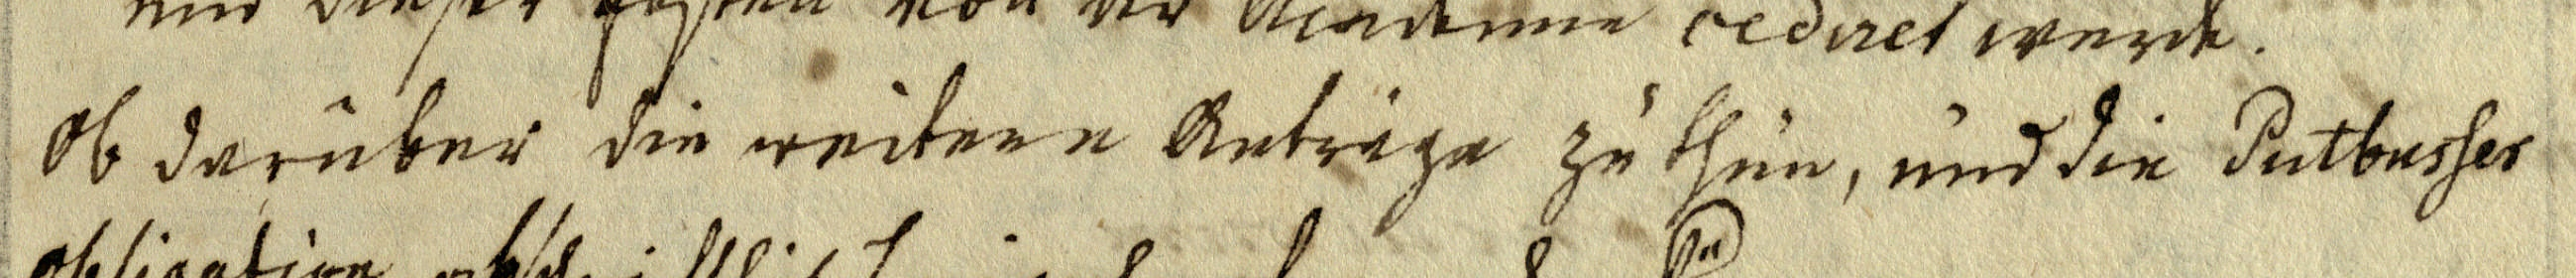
Ob darüber die weitern Anträge zu thun, und die Putbusser
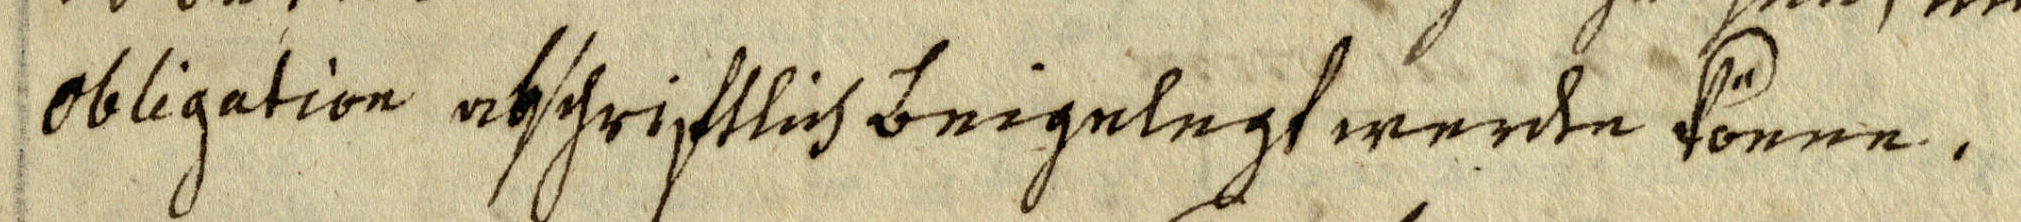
Obligation abschriftlich beigelegt werden könne.
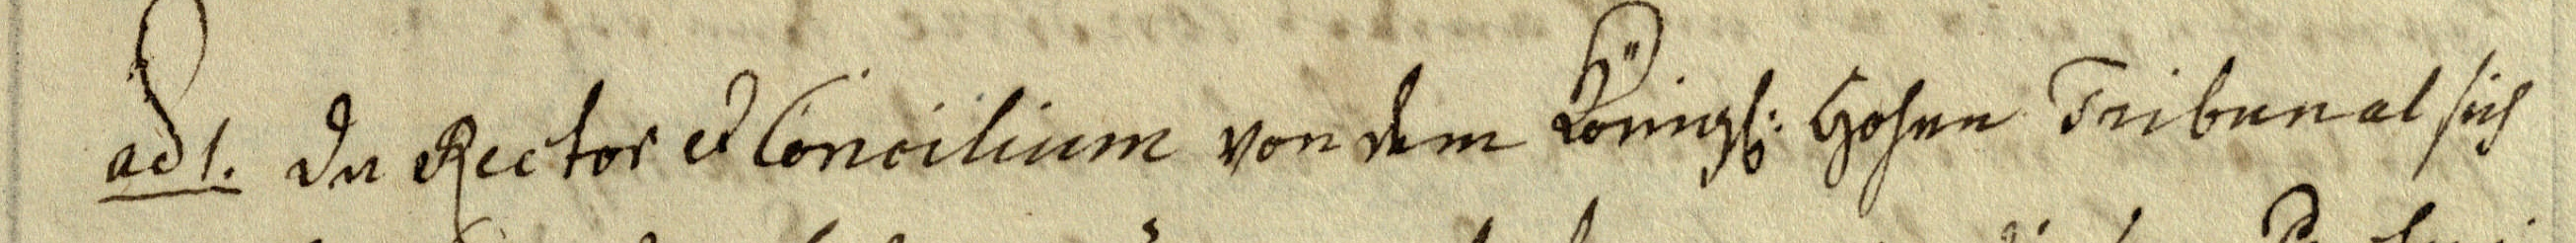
ad1. da Rector et Concilium von dem Königl: Hohen Tribunal sich
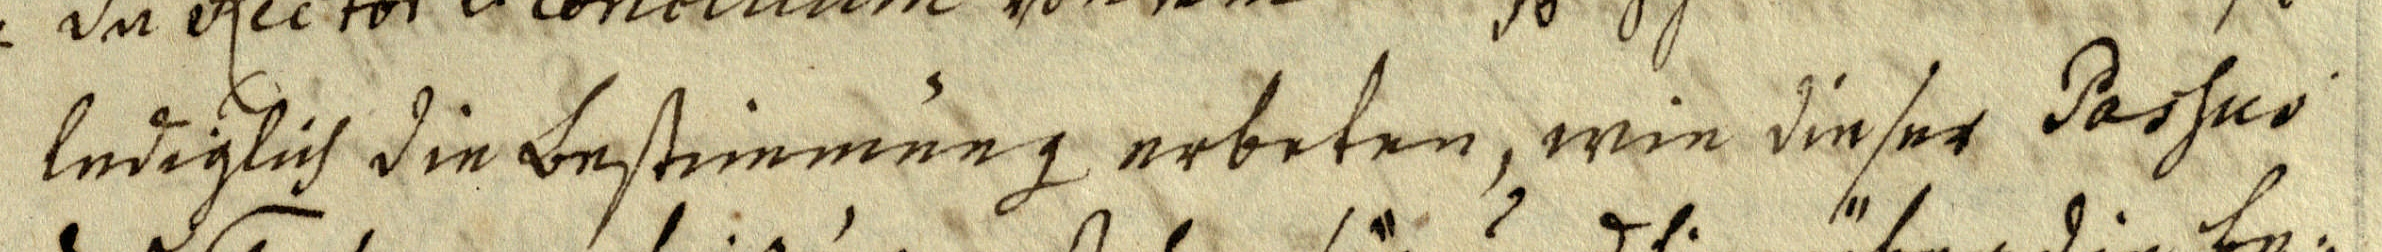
lediglich die Bestimmung erbeten, wie dieser Passus
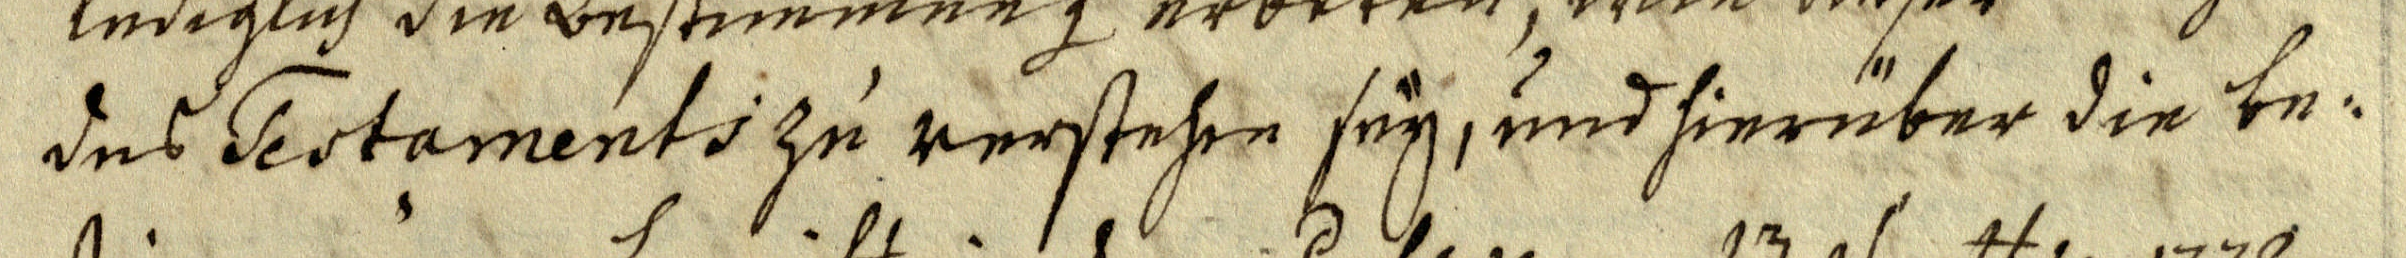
des Testaments zu verstehen seÿ, und hierüber die be¬
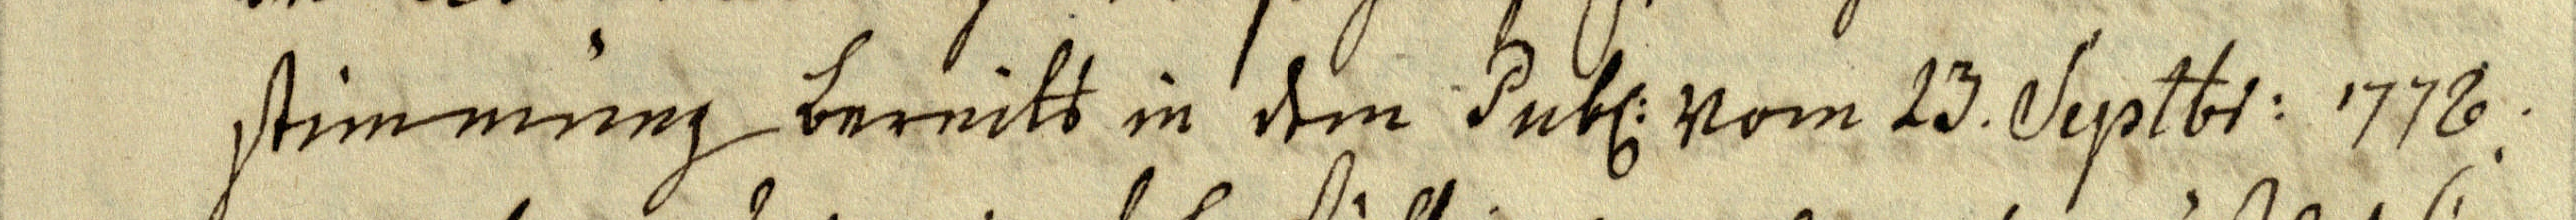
stimmung bereits in dem Publ: vom 23. Septbr: 1778
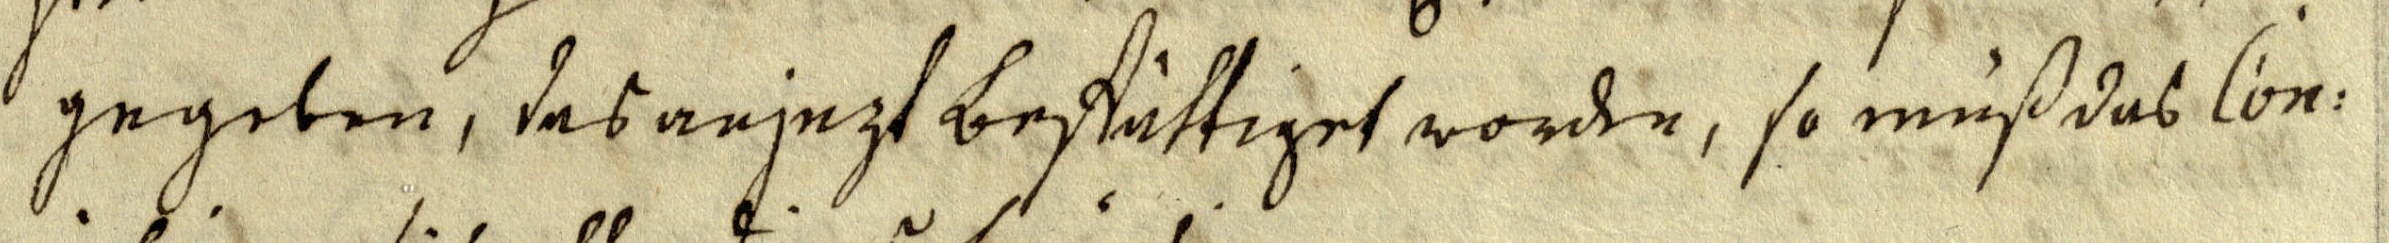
gegeben, das anjezt bestättiget worden, so muß das Con¬
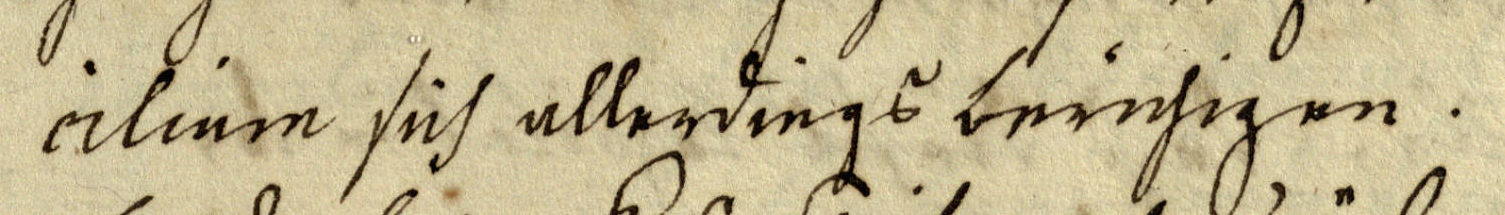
cilium sich allerdings beruhigen.
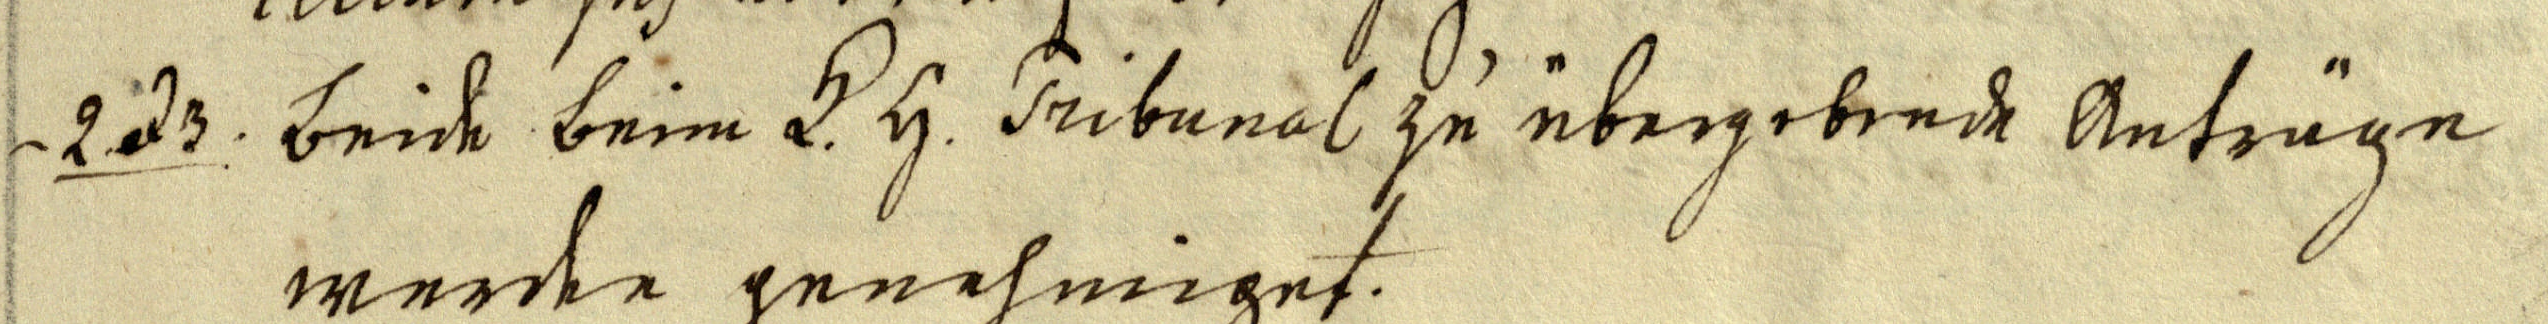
2 et 3. beide beim K. H. Tribunal zu übergebende Anträge
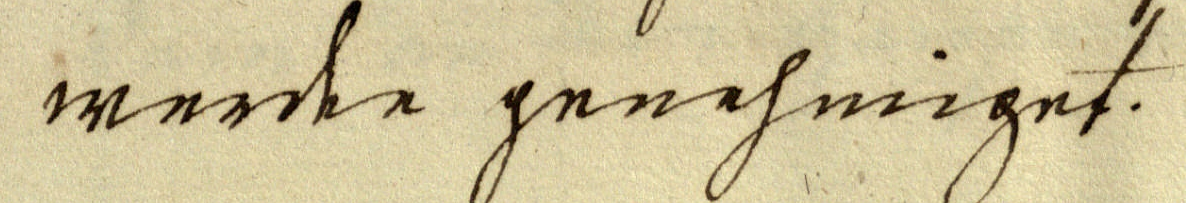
werden genehmiget.
